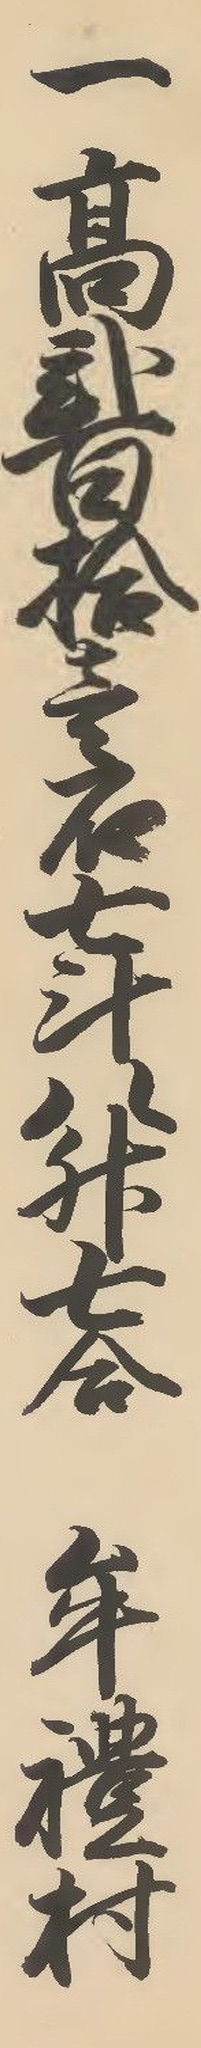一高弐百拾壱石七斗八升七合牟礼村
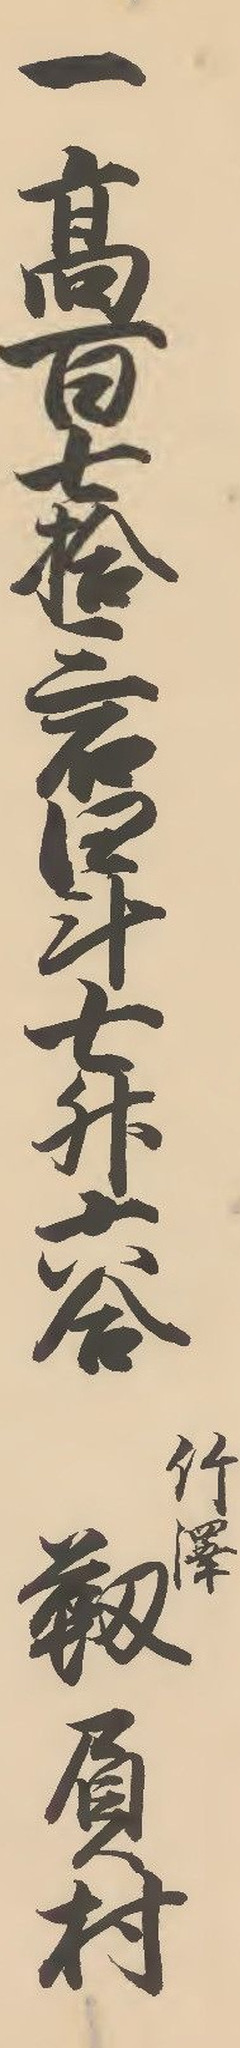一高百七拾三石四斗七升六合靭負村
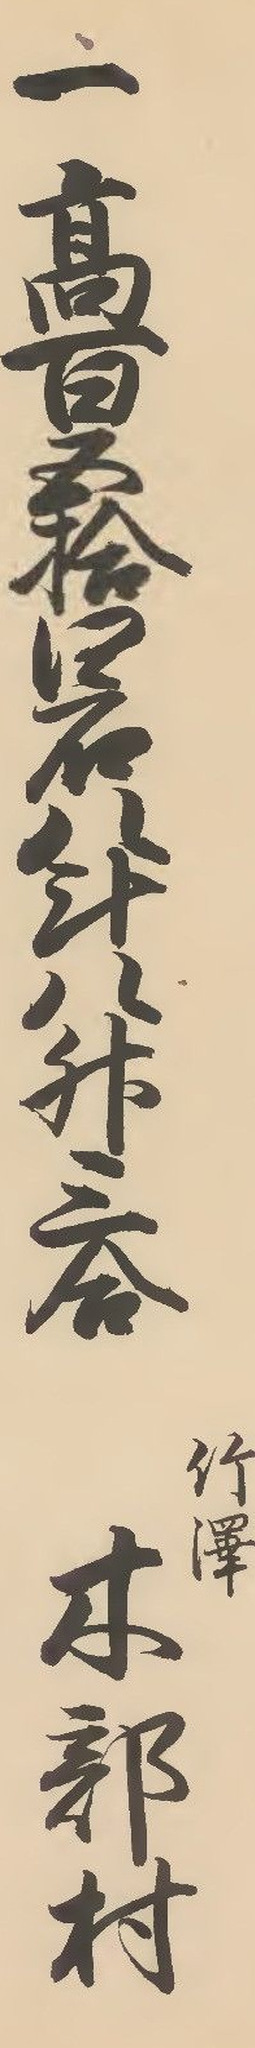一高百五拾四石八斗八升三合木部村
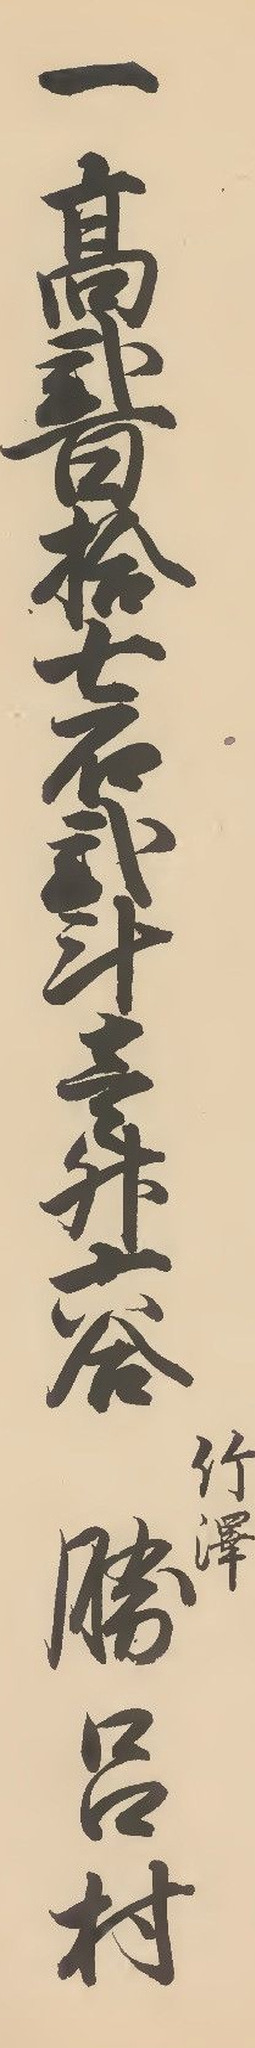一高弐百拾七石弐斗壱升六合勝呂村
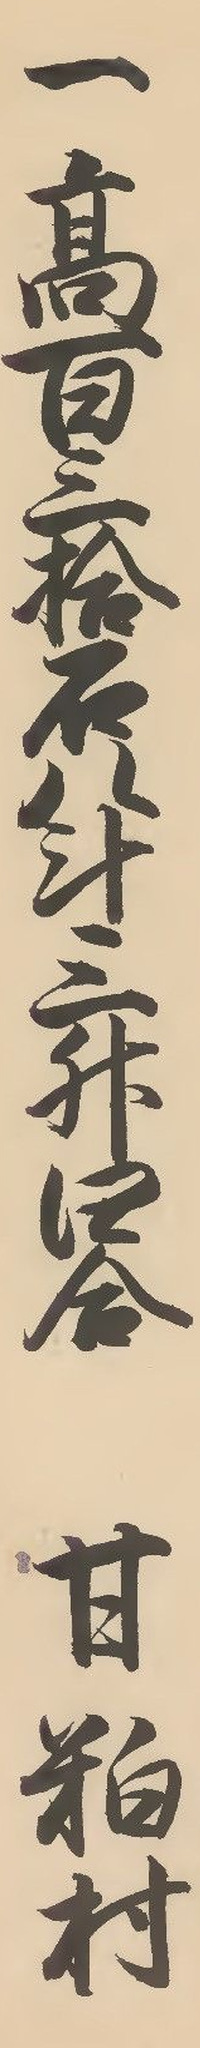一高百三拾石八斗三升四合甘粕村

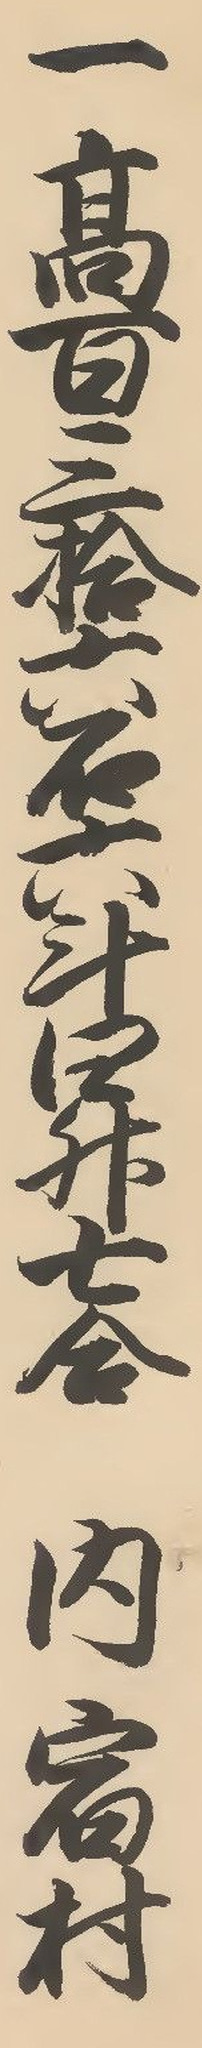一高百三拾六石六斗四升七合内宿村
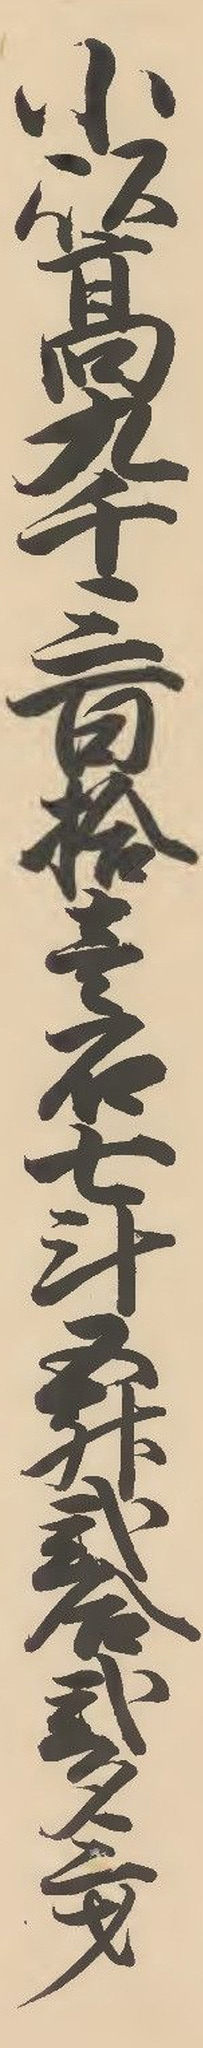小以高九千三百拾壱石七斗五升弐合弐勺三才
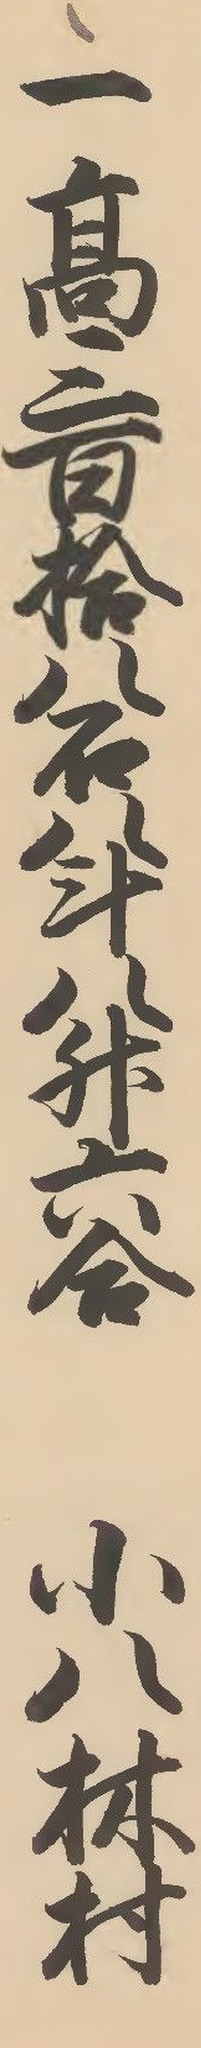一高三百拾八石八斗八升六合小八林村
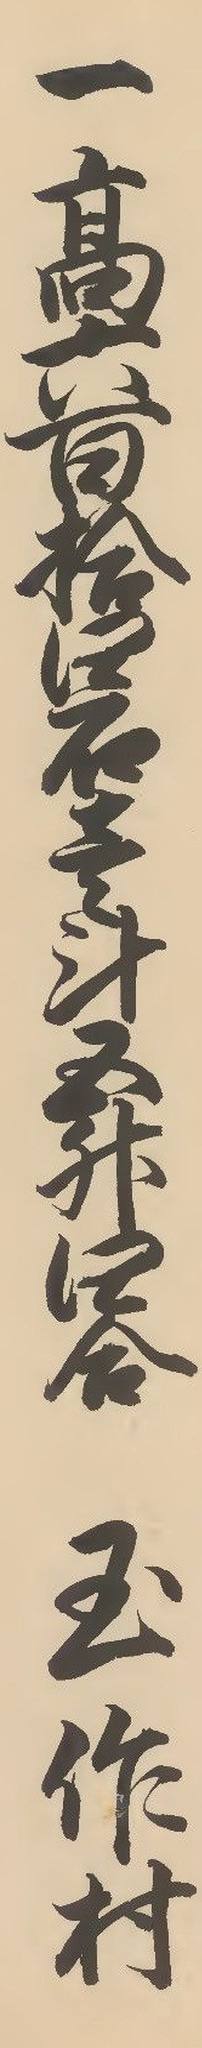一高六百拾四石壱斗五升四合玉作村
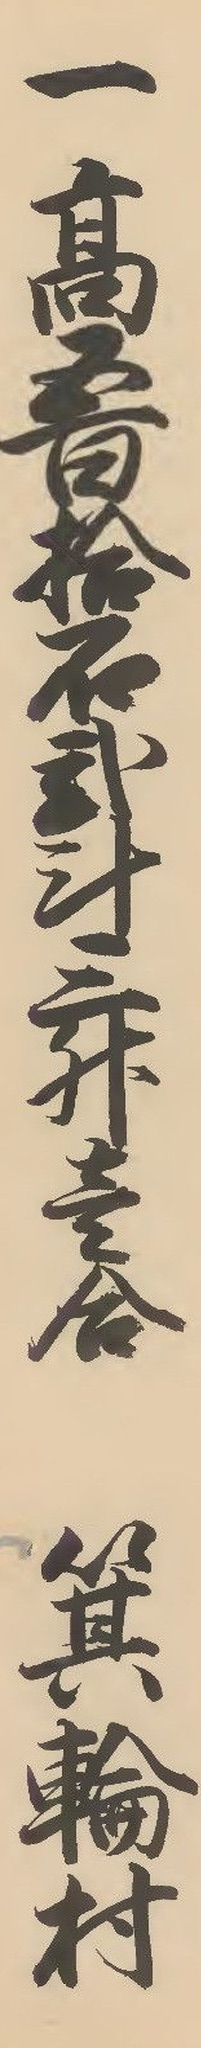一高五百拾石弐斗三升壱合箕輪村

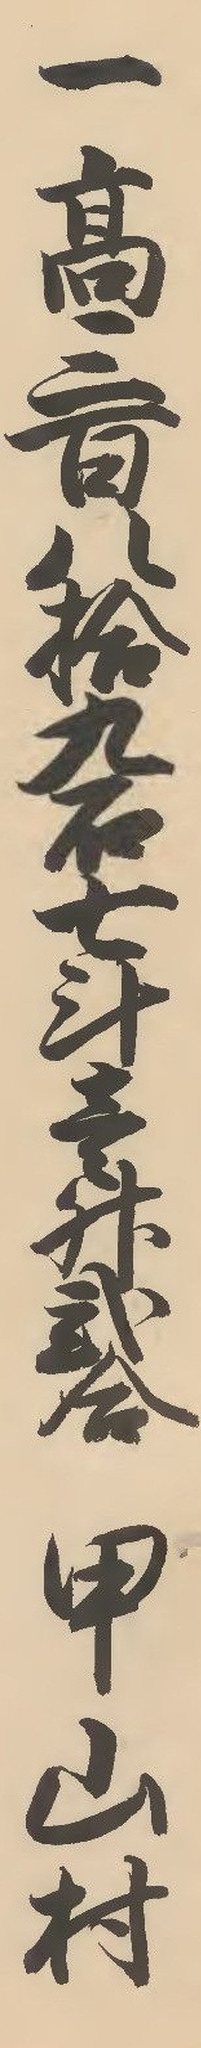一高三百八拾九石七斗壱升弐合甲山村
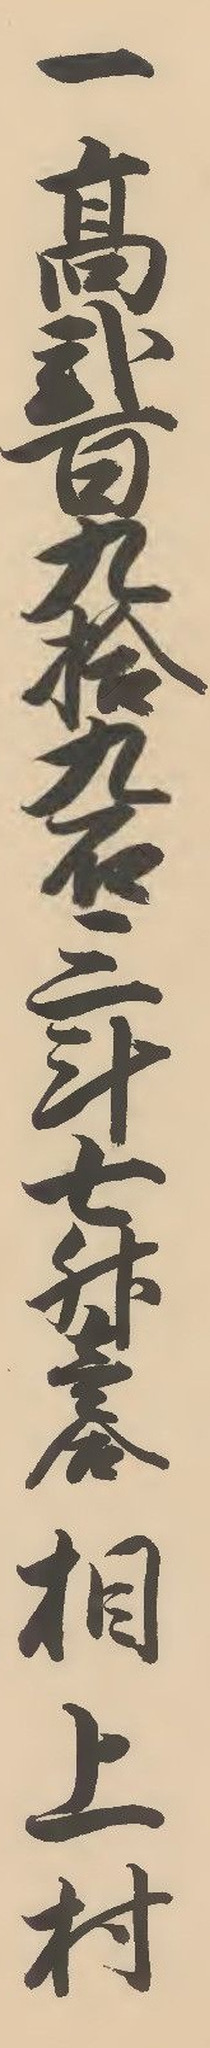一高弐百九拾九石三斗七升壱合相上村
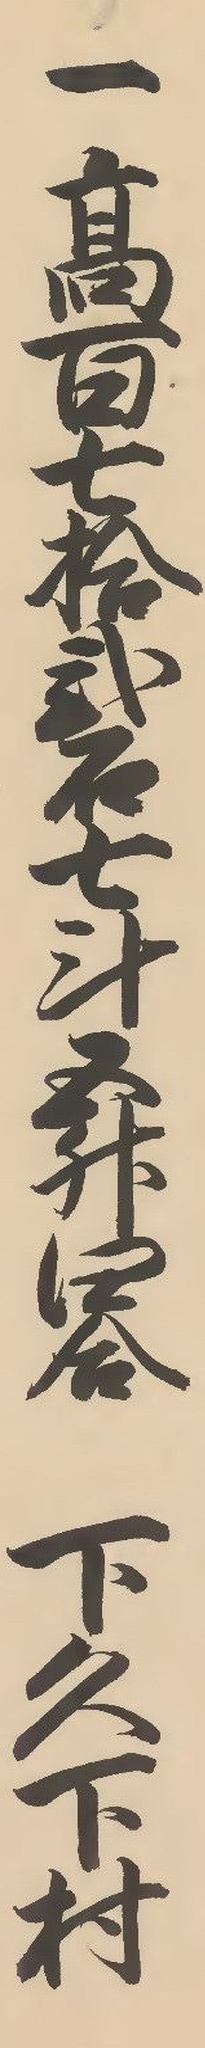一高百七拾弐石七斗五升四合下久下村
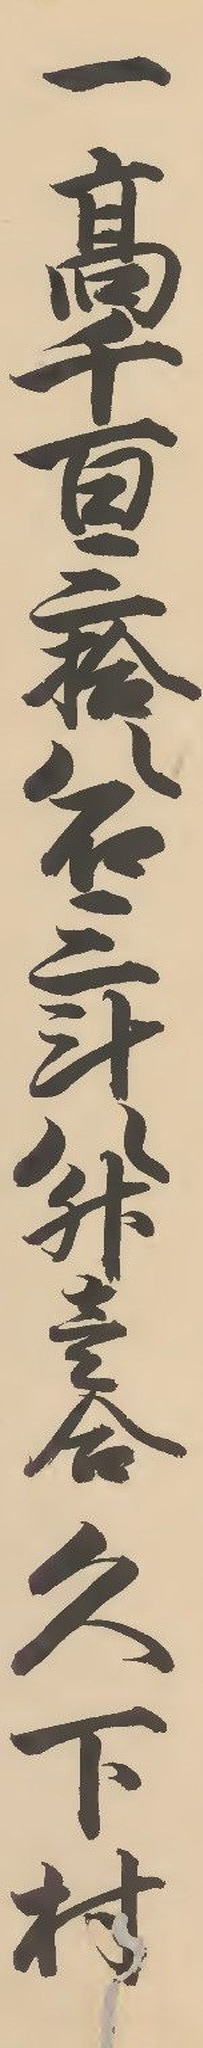一高千百三拾八石三斗八升壱合久下村
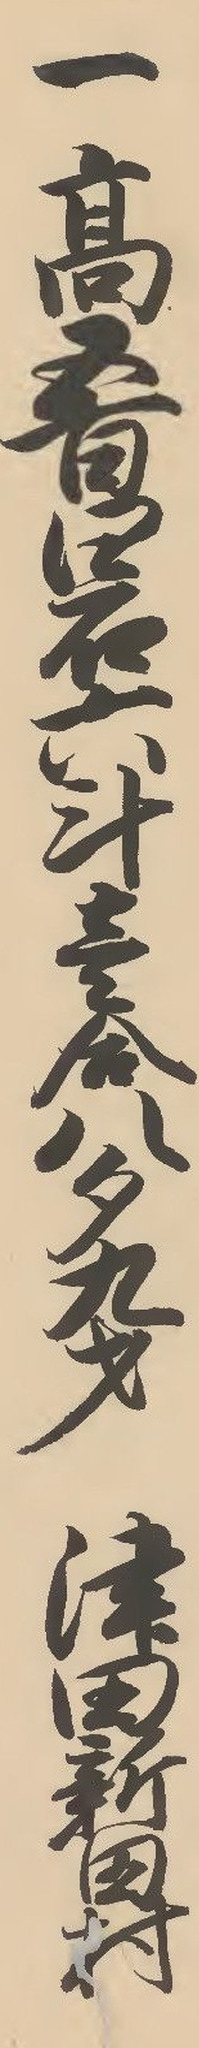一高五百四石六斗壱合八勺九才津田新田村
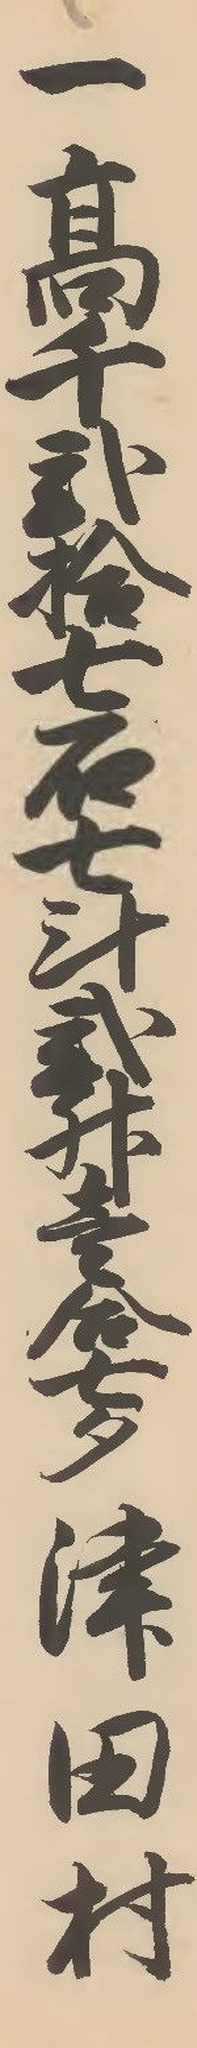一高千弐拾七石七斗弐升壱合七勺津田村
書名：武蔵国郷帳　上
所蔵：国立公文書館 National Archives of Japan
